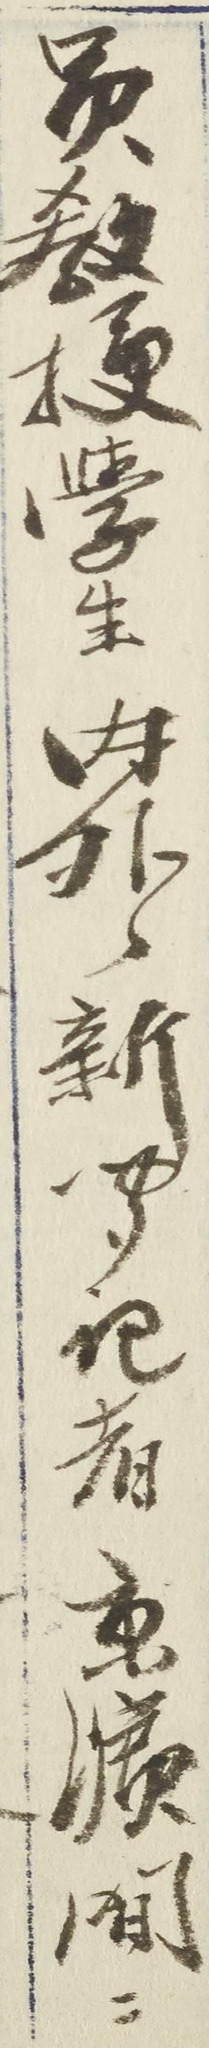員教授学生内外ノ新聞記者東濱間ニ
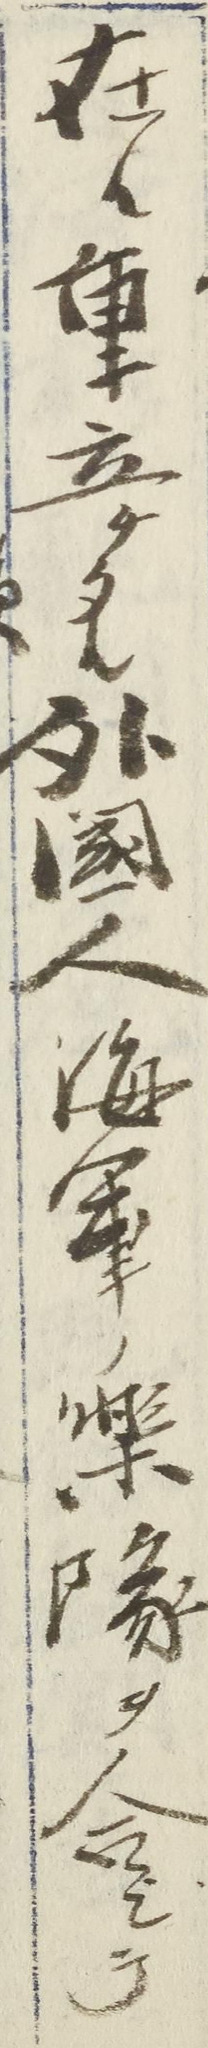在ル重立チタル外国人海軍ノ楽隊ヲ合シテ
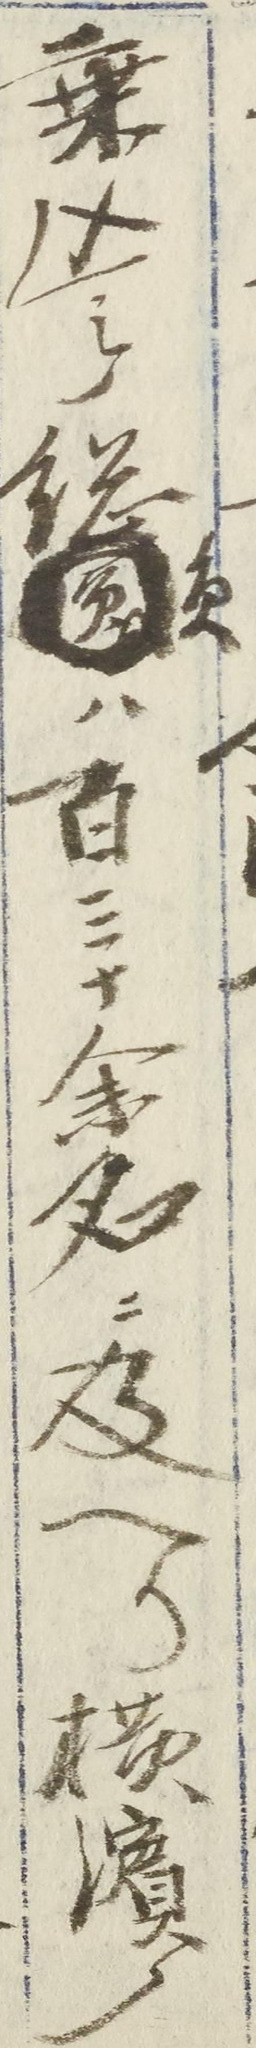乗込シノ総員ハ百三十余名二及ヘリ横浜ノ
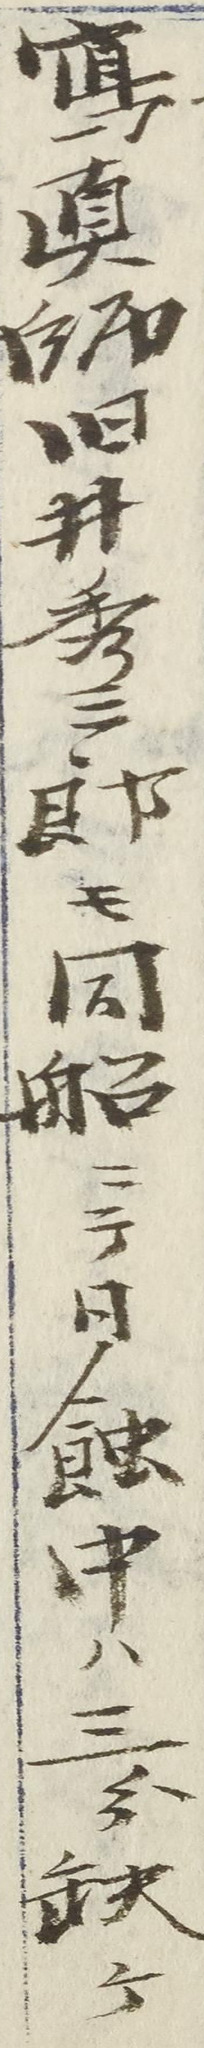写真師旧井秀三郎モ同船ニテ日蝕中ハ三分欠ケ
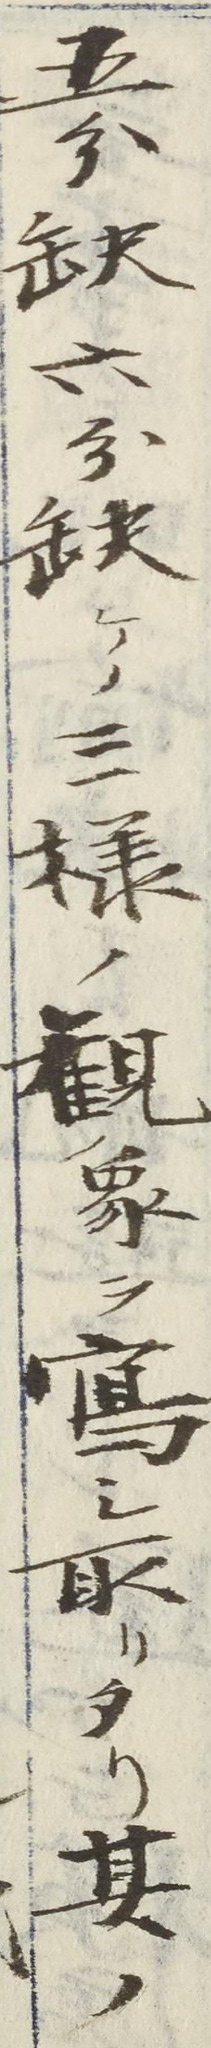五分欠六分欠ケノ三様ノ観象ヲ写シ取リタリ其ノ
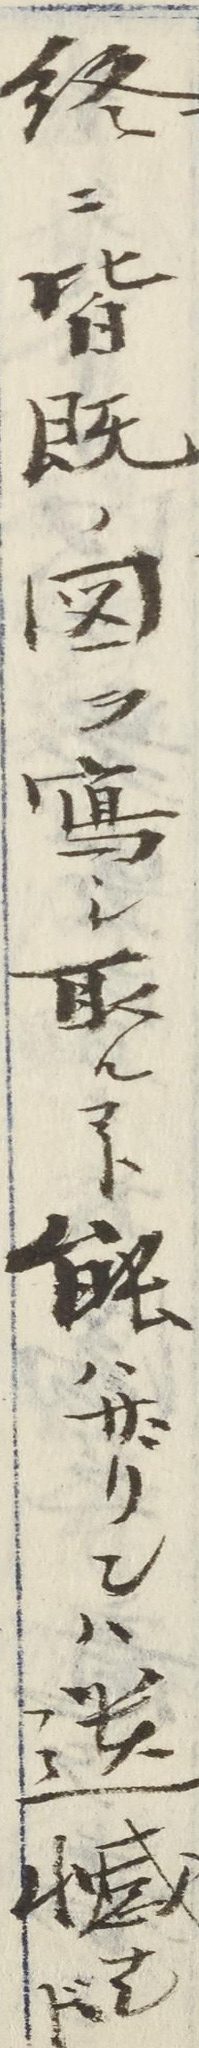終二皆既ノ図ヲ写シ取ルコト能ハザリシハ遺憾ナレド
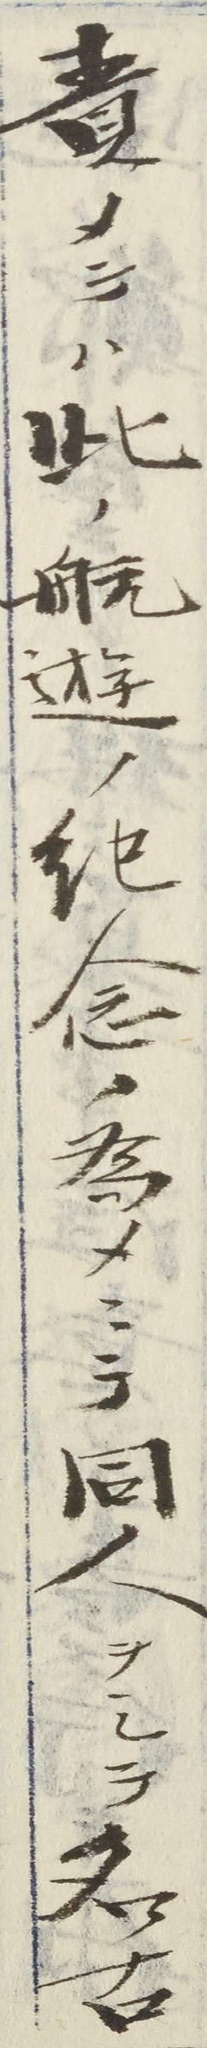責メテハ此ノ航遊ノ紀念ノ為メニテ同人ヲシテ名古
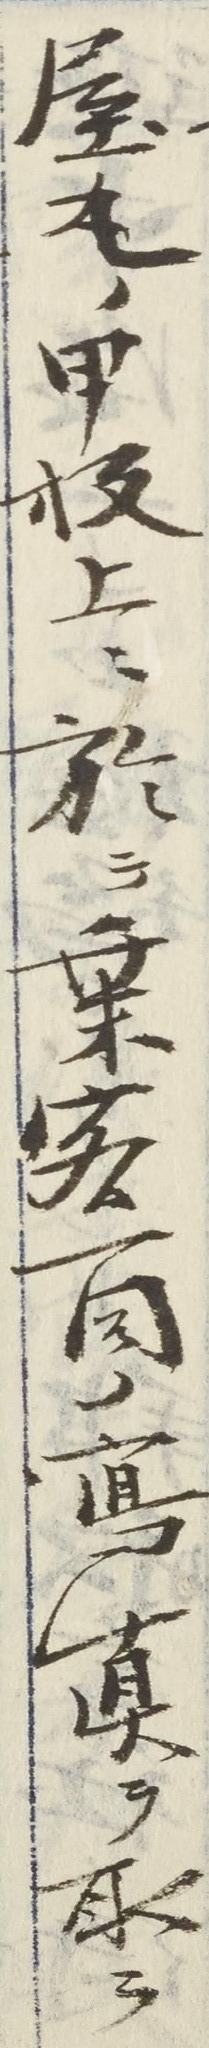屋丸ノ甲板上ニ於テ乗客一同ノ写真ヲ取ラ
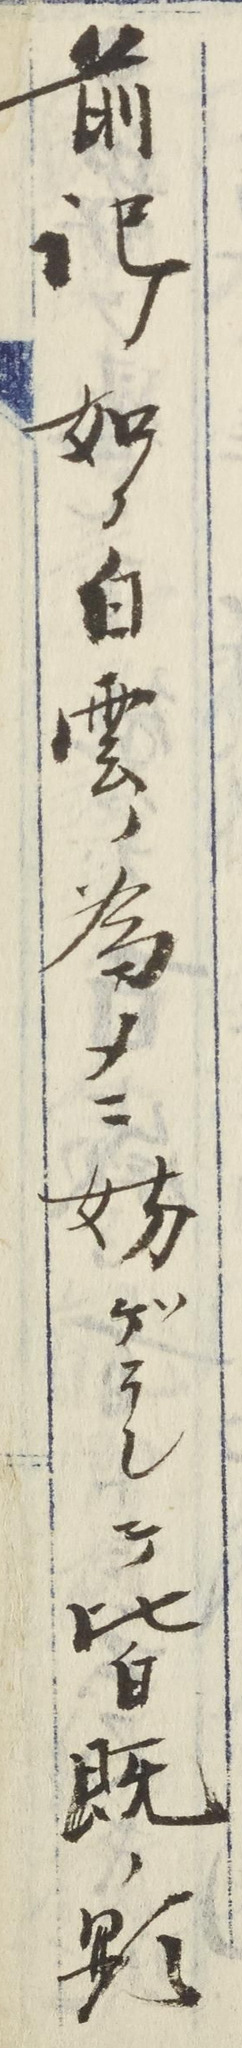前記ノ如ク白雲ノ為メニ妨ゲラレテ皆既ノ影

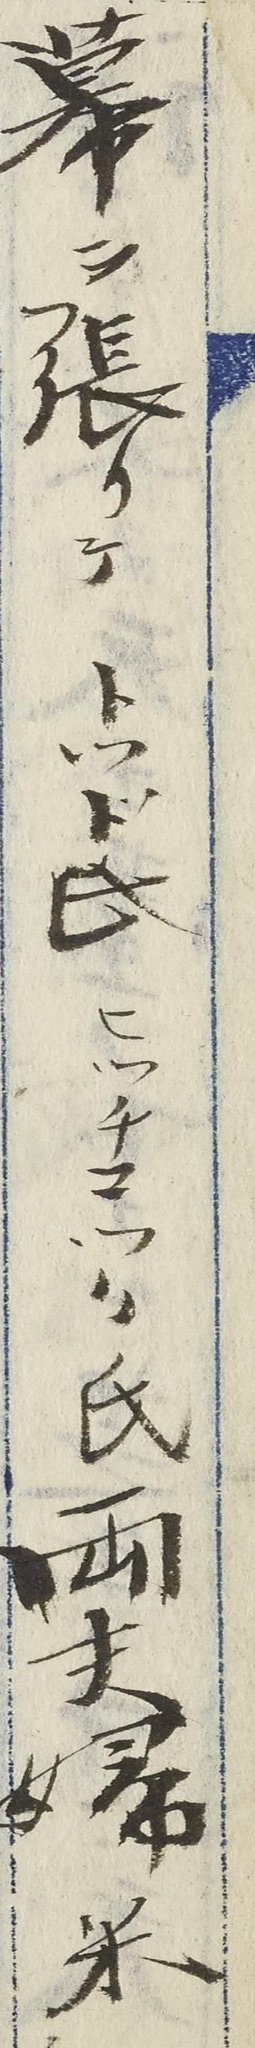幕ヲ張リテトツド氏ヒツチコツク氏両夫婦米
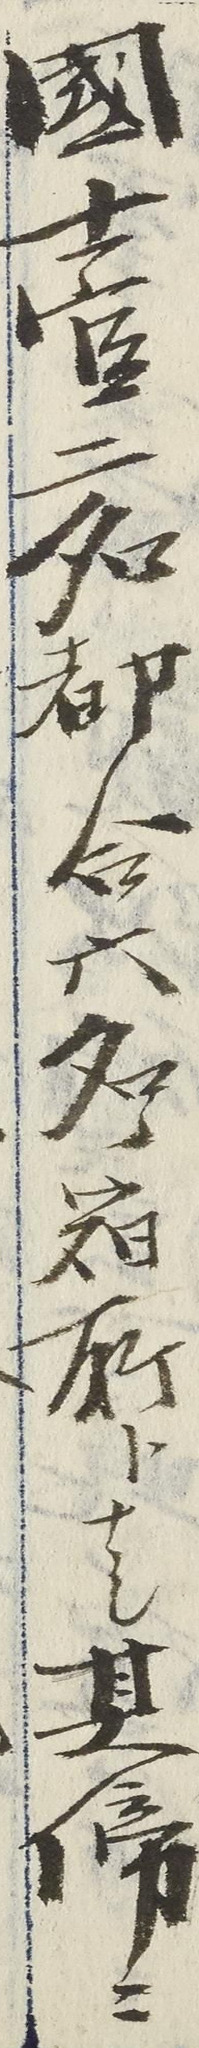国士官二名都合六名宿所トナシ其傍二
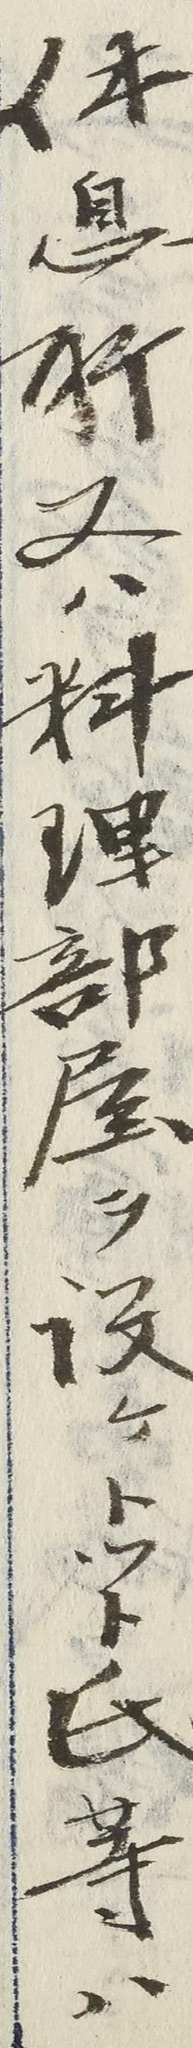休息所又ハ料理部屋ヲ設ケトツト氏等ハ
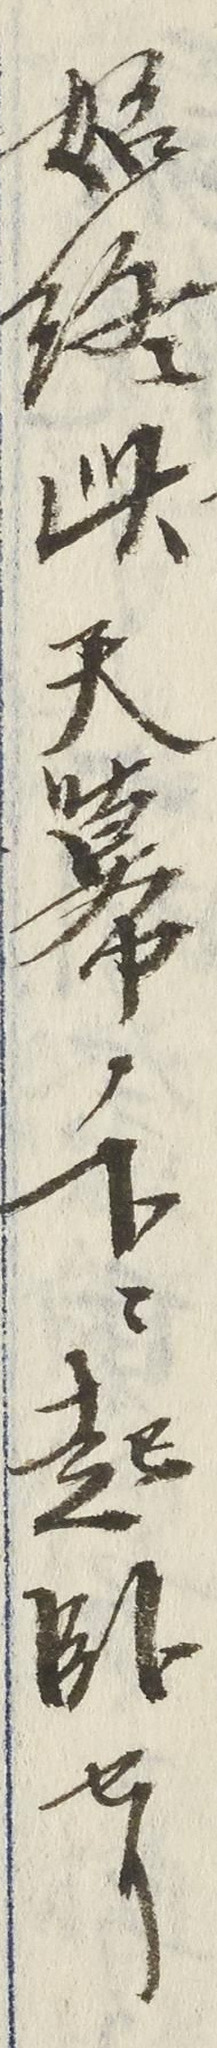始終此天幕ノ下ニ起臥セリ
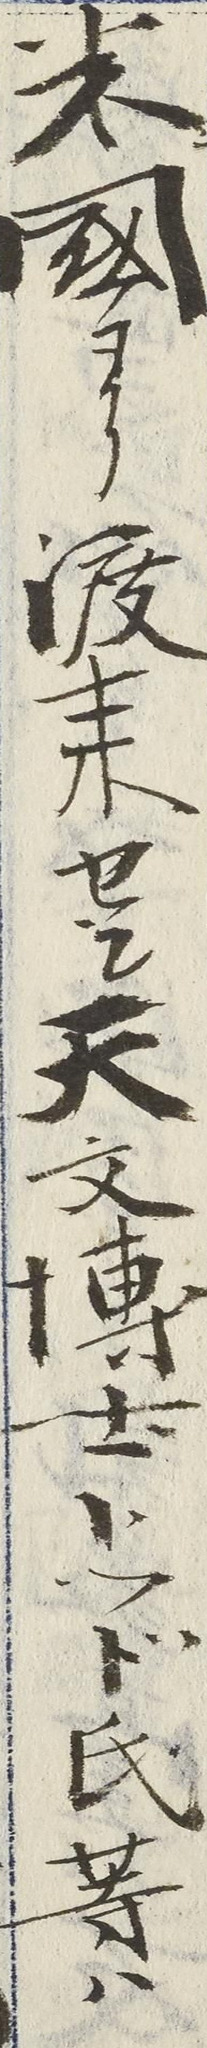米国ヨリ渡来セシ天文博士トツド氏等ハ
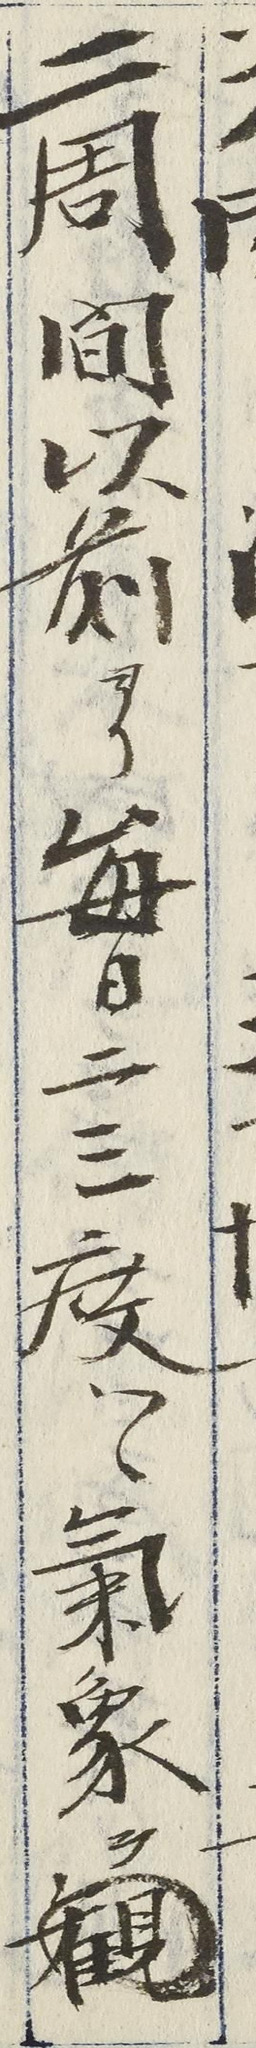二週間以前ヨリ毎日二三度ツヽ気象ヲ
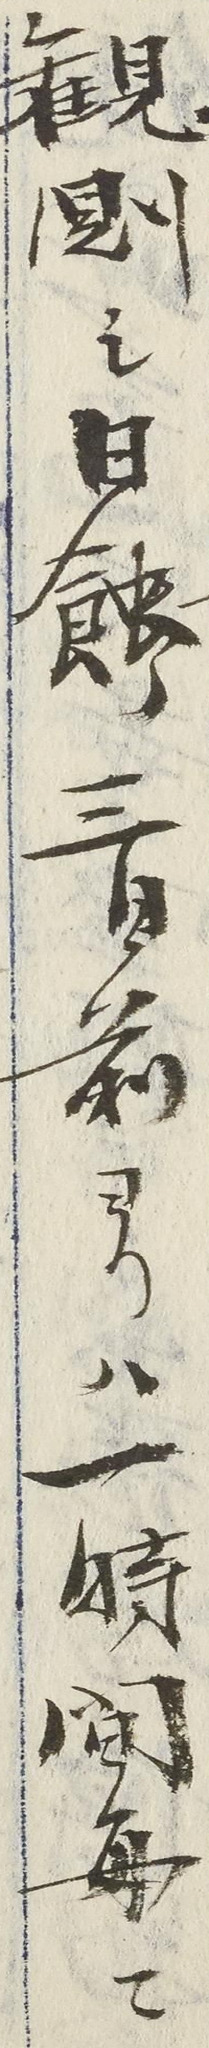観測シ日蝕ノ三日前ヨリハ一時間毎ニ
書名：日蝕録　全
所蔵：東京大学地震研究所図書室 Earthquake Research Institute Library, The University of Tokyo, JAPAN
